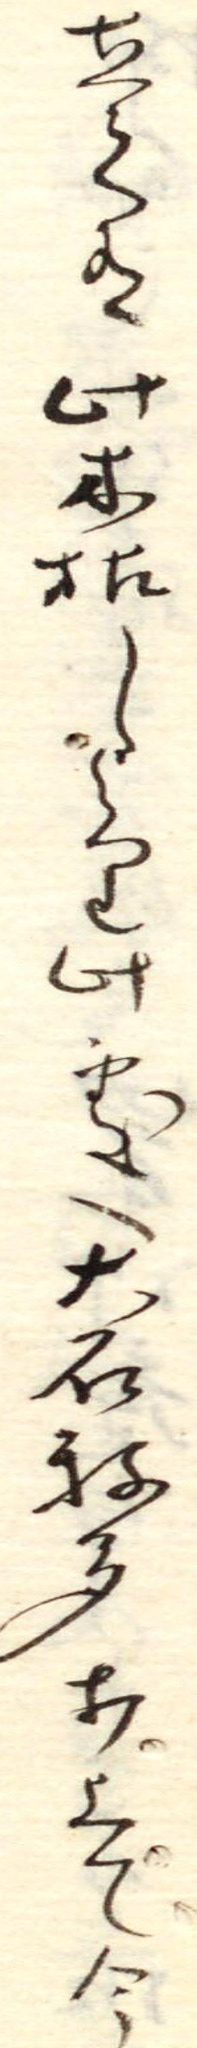立て有此木枯しより此処へ大石数多打上て今
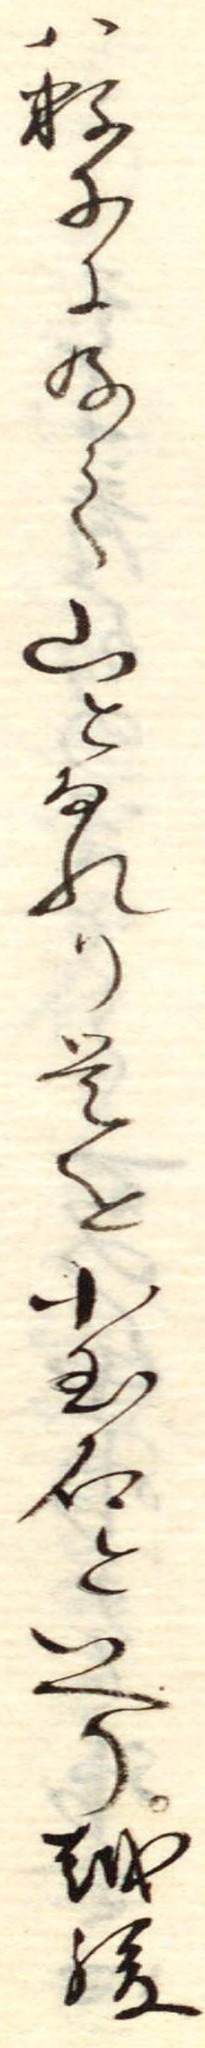は数千に及て山となれり是を小玉石といへり越後
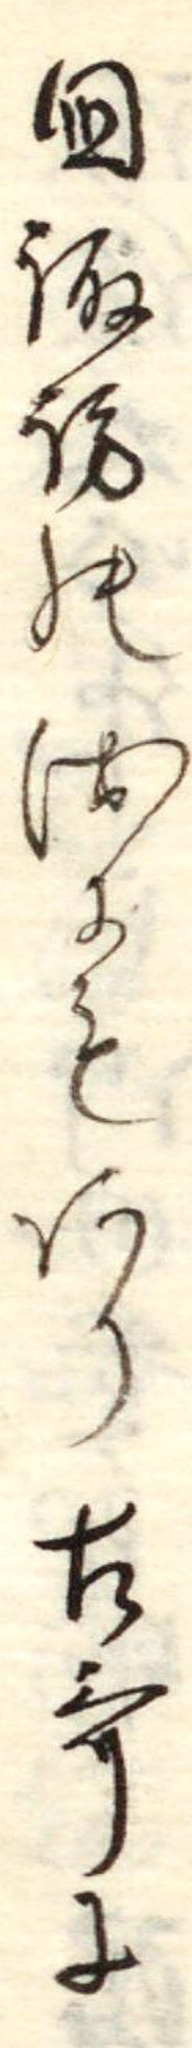国諏訪の間にもあり古哥に
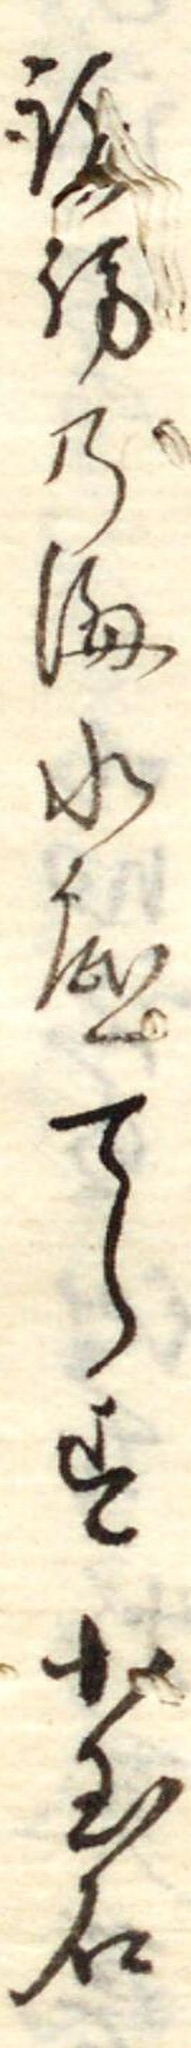諏訪の海水底てらす小玉石
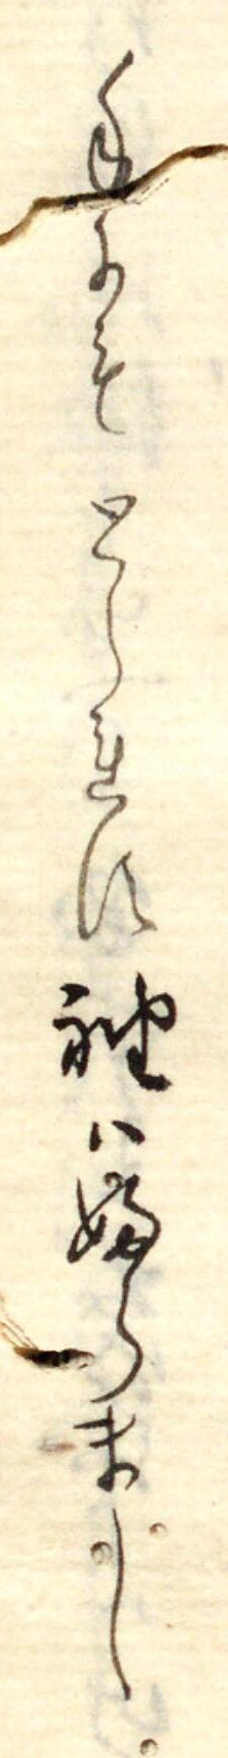手にもとられす袖はふらまし

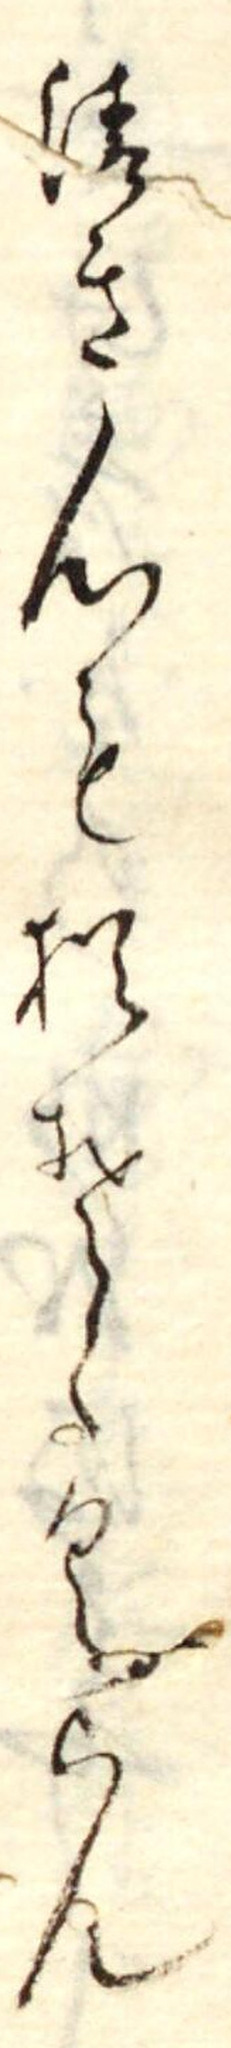清き心も猶そしくらん
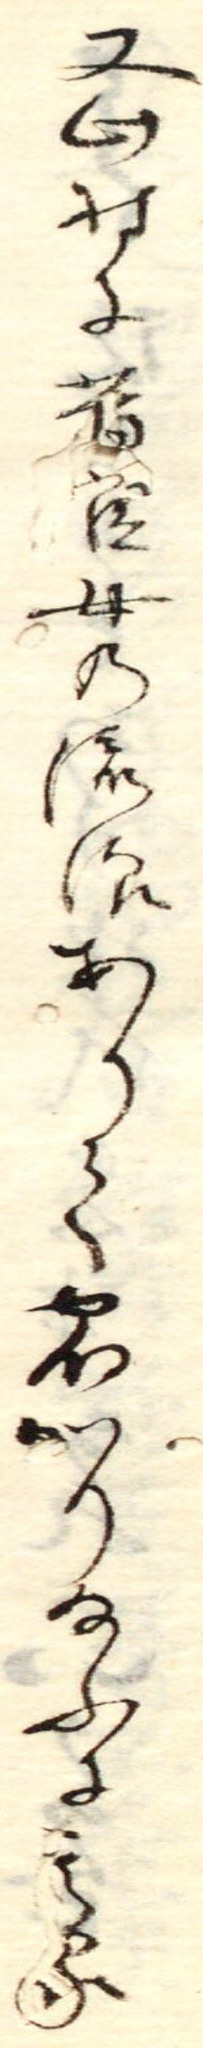又此村に昔女の流浪ありて宿かり給ふに其家
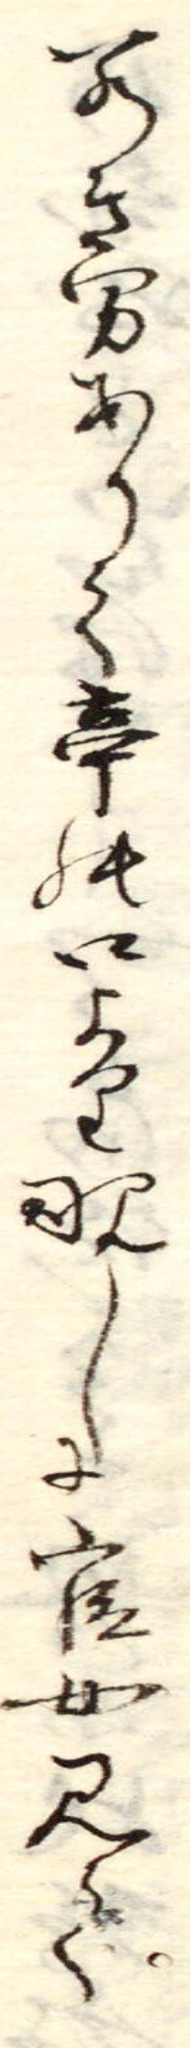若き男ありて亭の口より覗しに官女見て
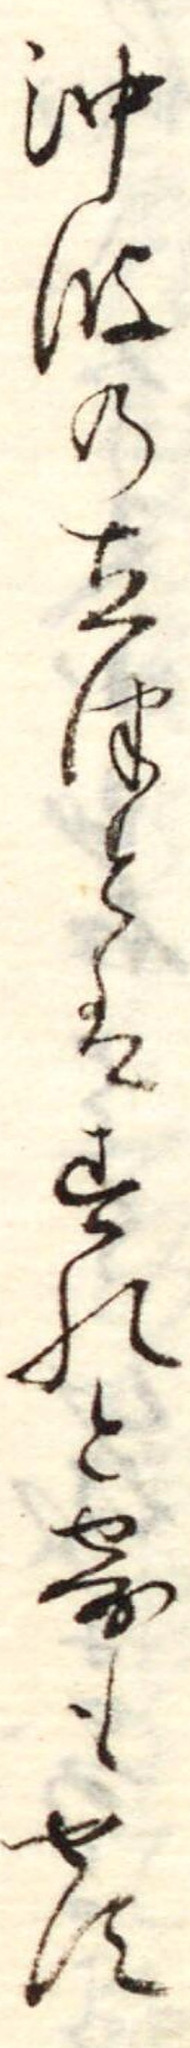沖波の立つとはすれと寄もせす
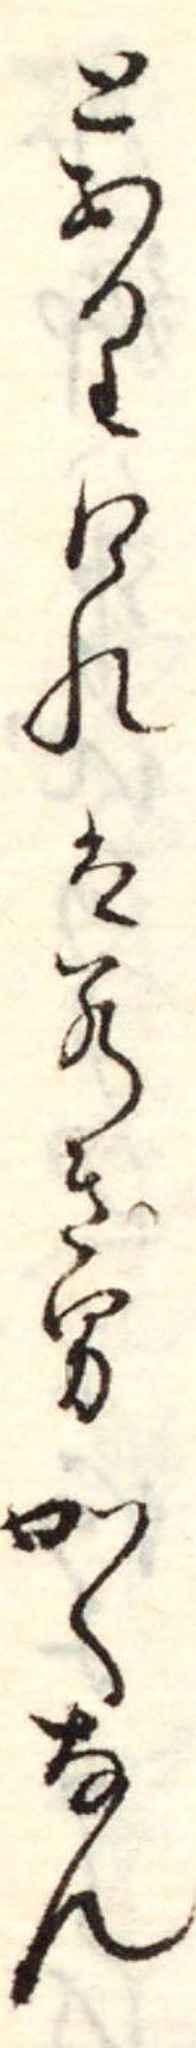とありけれは若き男かくなん
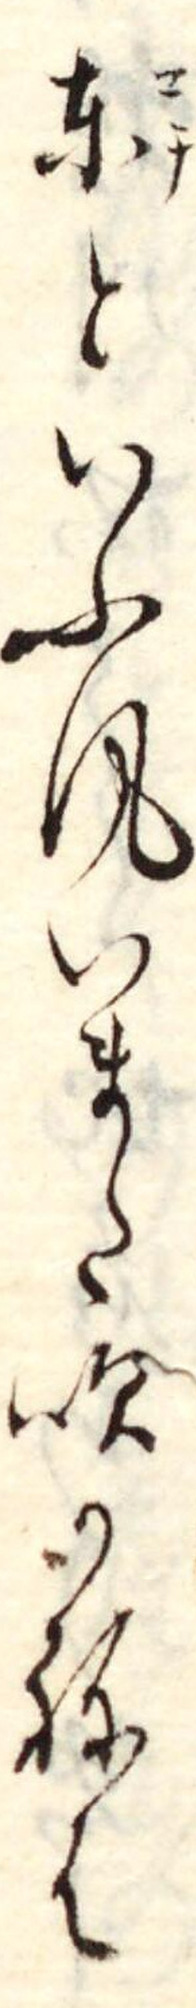東といふ風いまた吹かねは
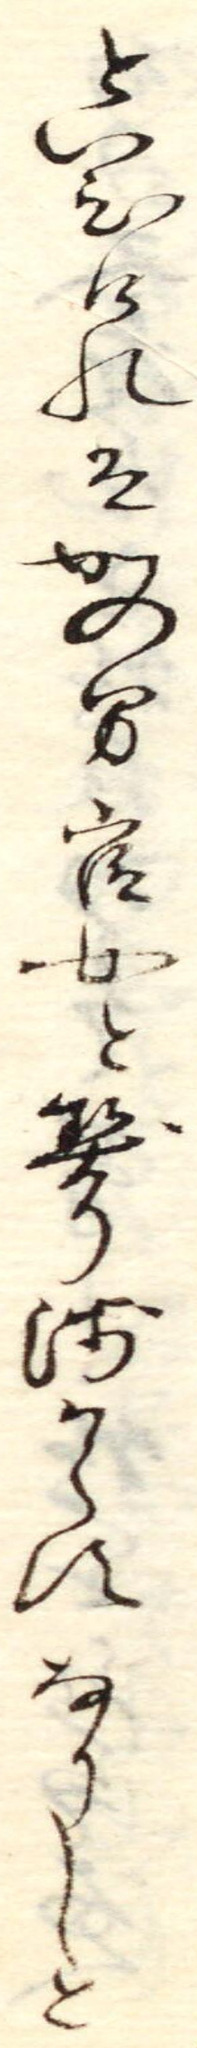といひけれはかの男官女と契り浅からすなりしと
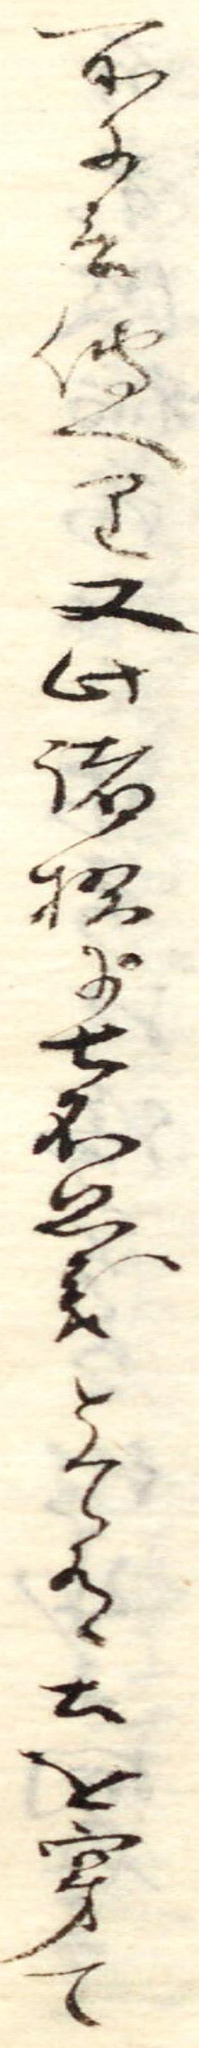所に言伝へり又此諸橋に七不思義とて有土を穿て
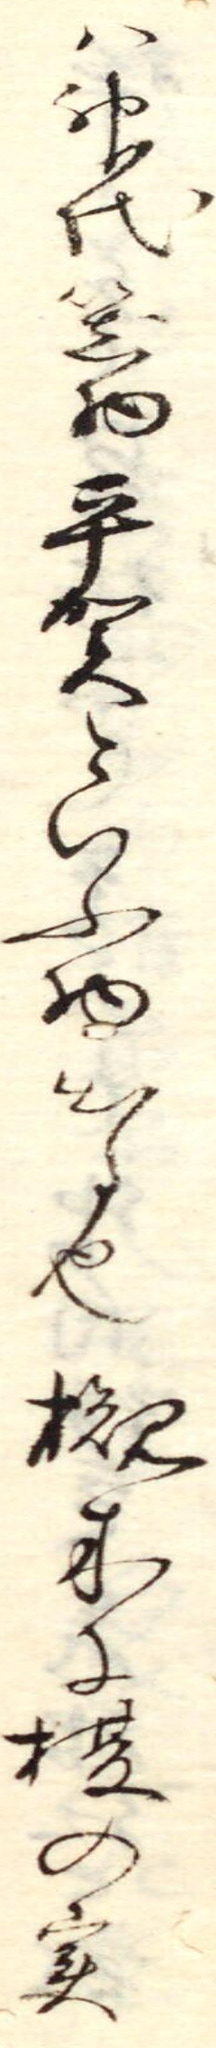は神代器物平賀といふ物出る也槻木に榎の実
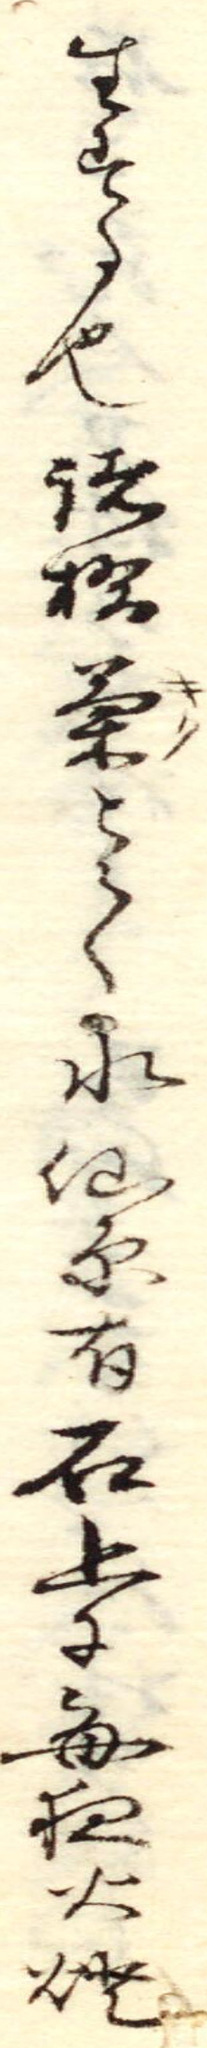生する也諸橋菊とて水仙原有石上に毎夜火燈
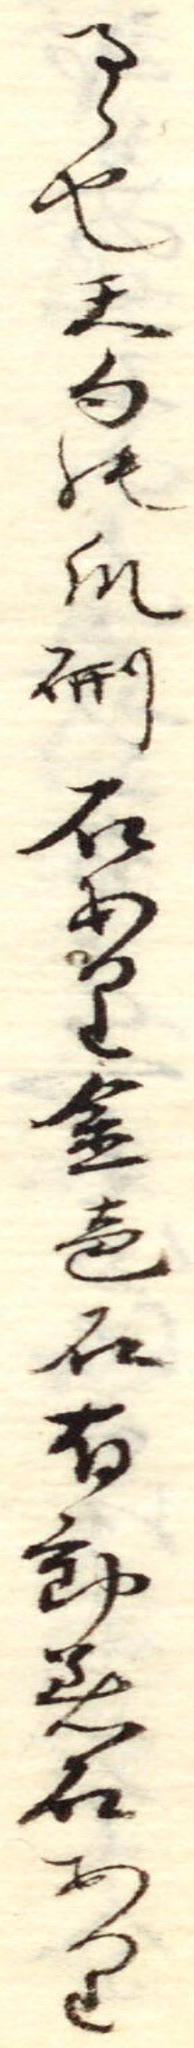る候也天句の爪研石あり金声石有動着石あり
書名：能登名跡誌
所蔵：Ishikawa Prefectural Library
